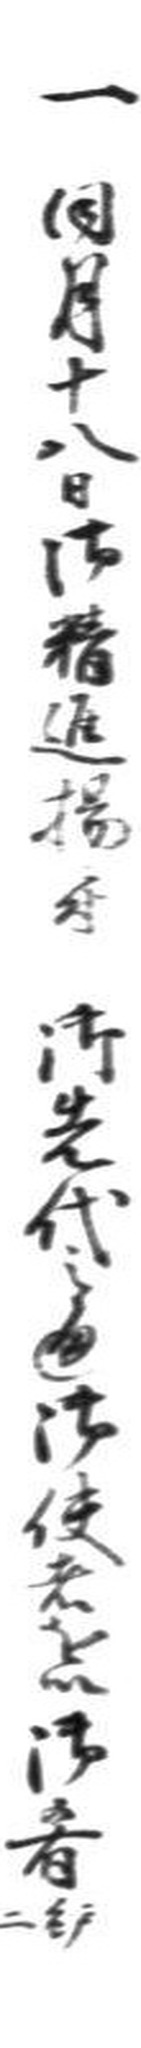一同月十八日御精進揚ニ付御先代之通御使者を以御肴鱸二
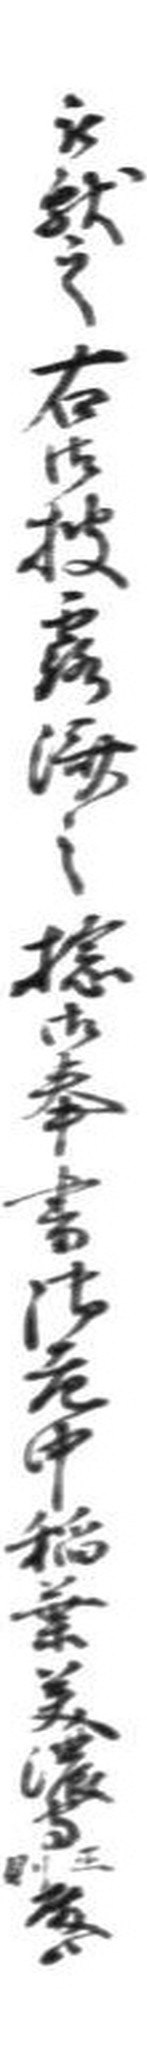被献之右御披露済之捻御奉書御老中稲葉美濃守正則殿ゟ

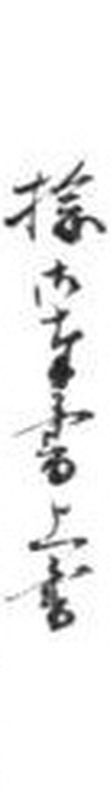捻御奉書上書
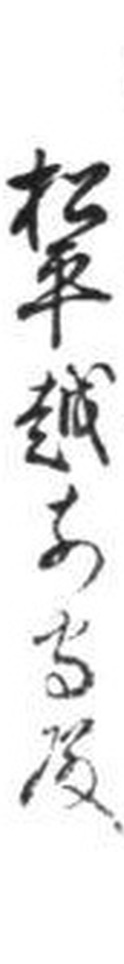松平越前守殿
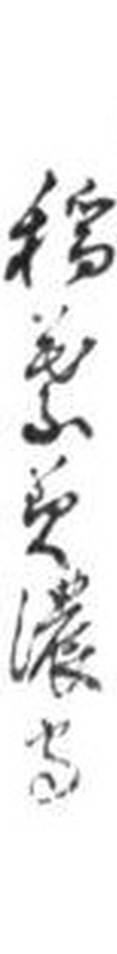稲葉美濃守
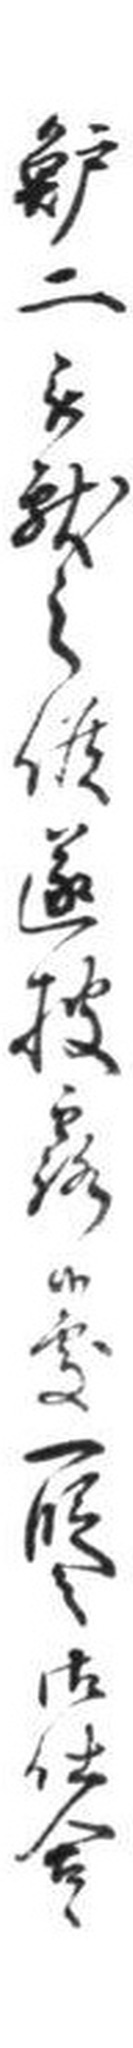鱸二被献之候遂披露候処一段之御仕合候
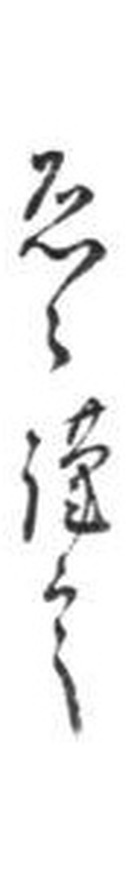恐々謹言
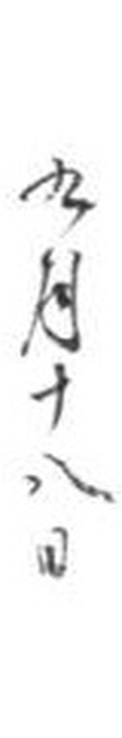九月十八日
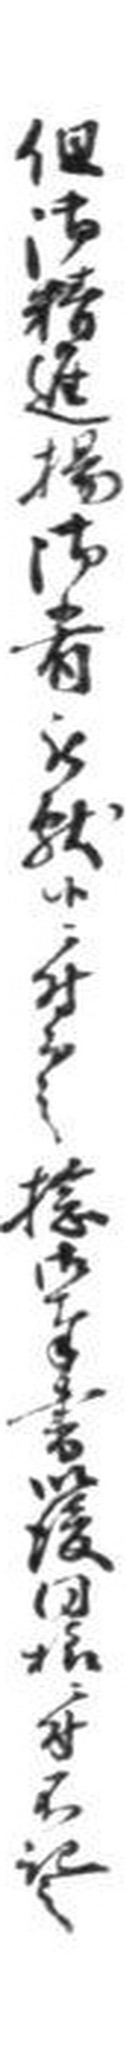但御精進揚御肴被献候ニ付而之捻御奉書以後同様ニ付不記之
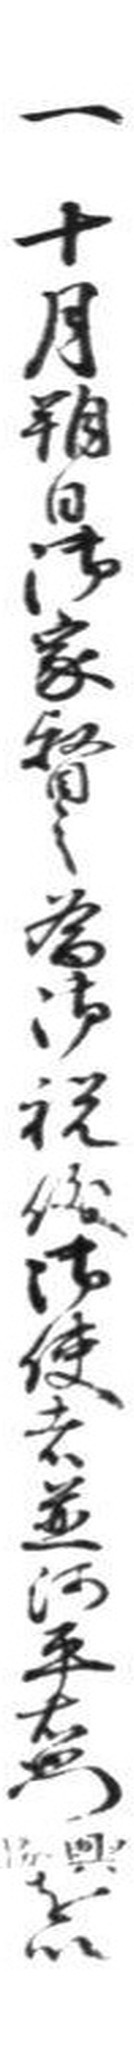一十月朔日御家督之為御祝儀御使者並河平右衛門興勝を以
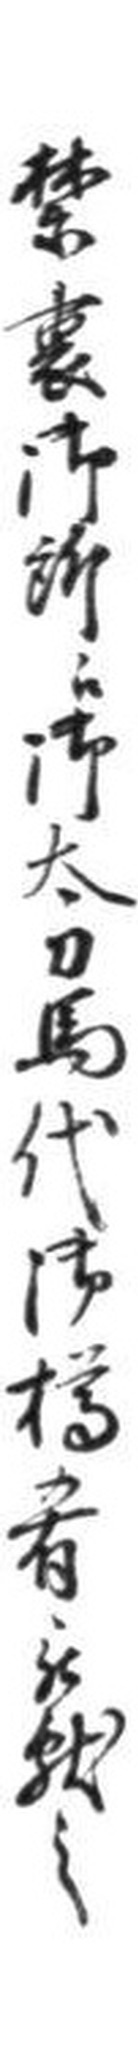禁裏御所江御太刀馬代御樽肴被献之
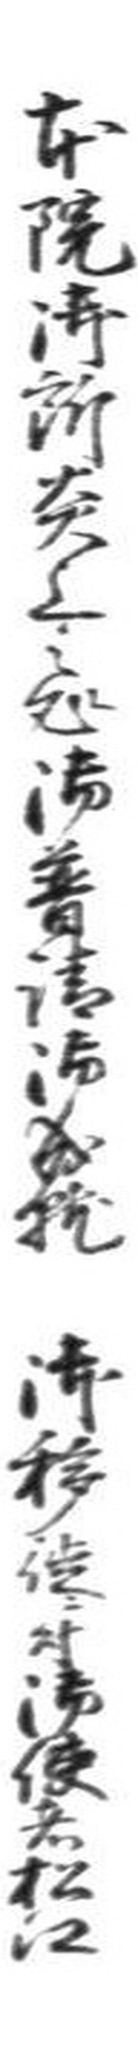本院御所炎上之処御普請御成就御移徙ニ付御使者松江
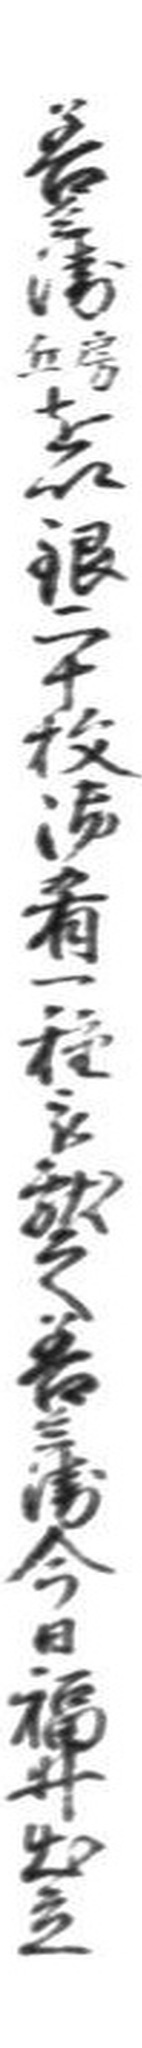善兵衛房丘を以銀二十枚御肴一種被献之善兵衛今日福井出立
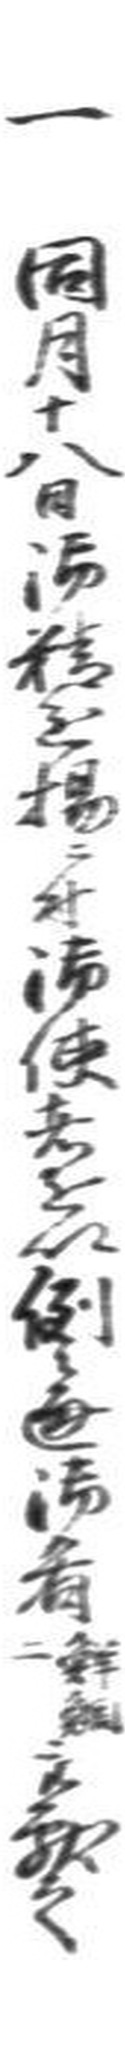一同月十八日御精進揚ニ付御使者を以例之通御肴鮮鯛二被献之
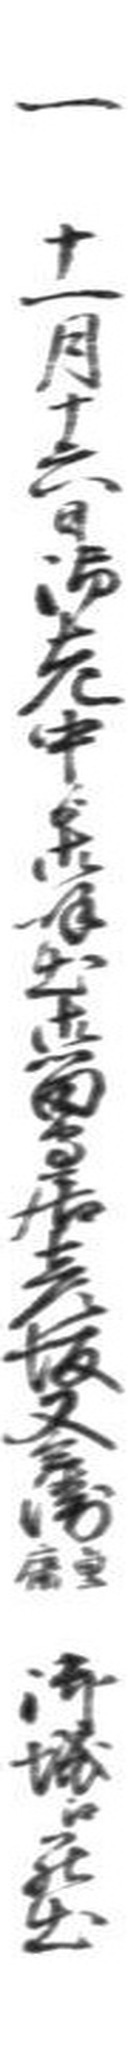一十一月十六日御老中ゟ御呼出御留守居彦坂又兵衛重庸御城江罷出

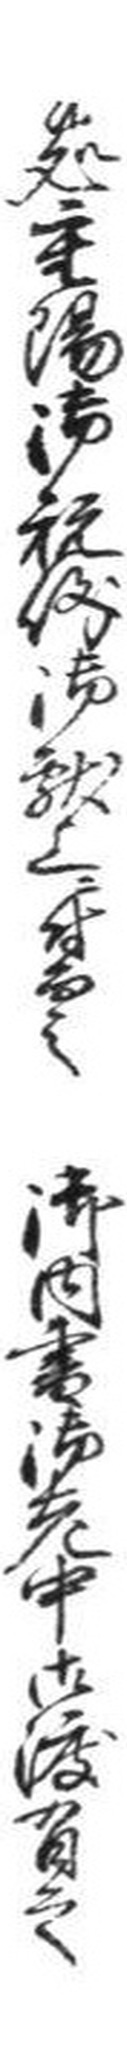候処重陽御祝儀献上ニ付而之御内書御老中御渡有之
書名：家譜 十三 綱昌公 従寛文元年到延宝五年
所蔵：福井県文書館 Fukui Prefectural Archives
